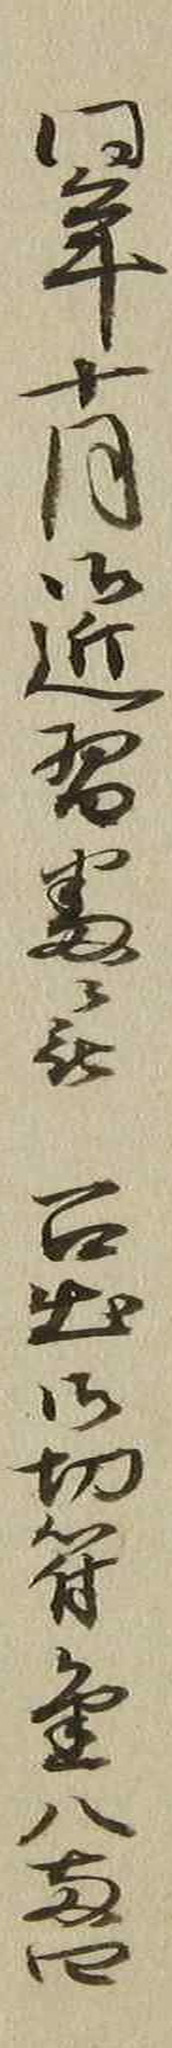一同年十月御近習番ニ被召出御切符勤八両四
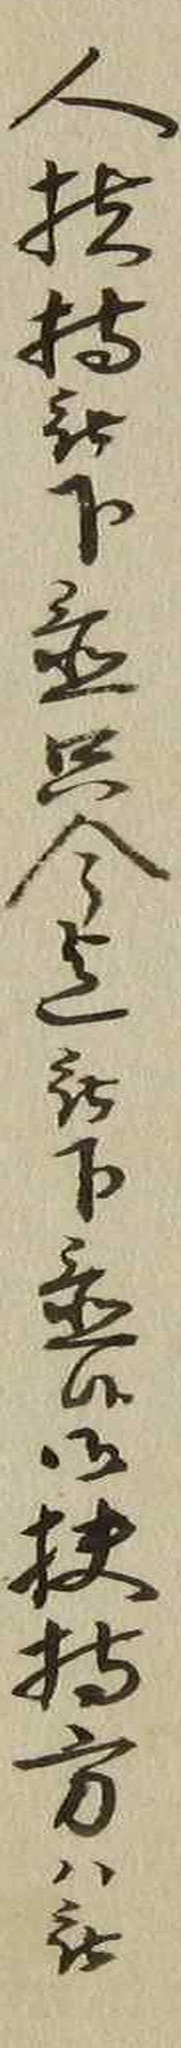人扶持被下置只今迄被下置候御扶持方ハ被
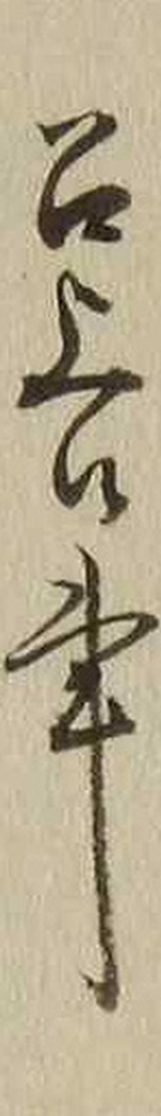召上候事
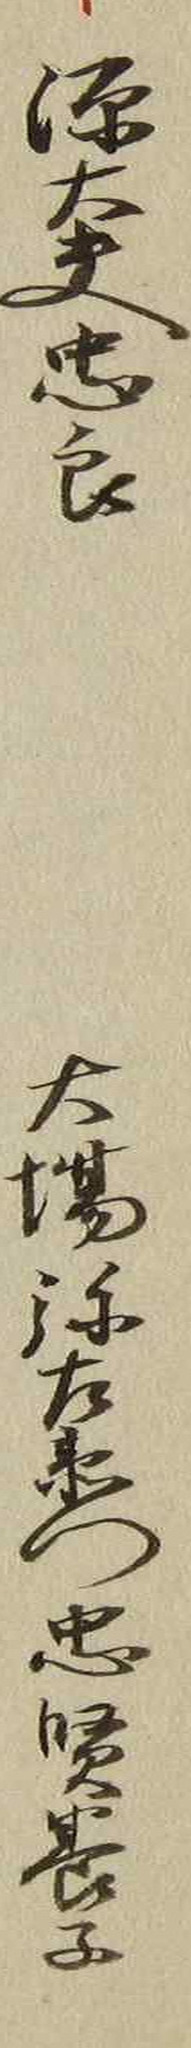源太夫忠良大場弥左衛門忠賢養子
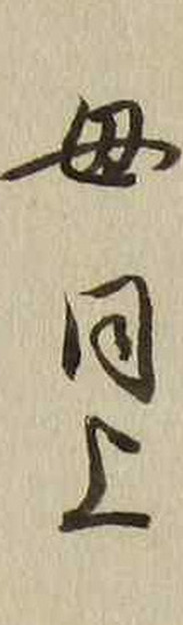母同上
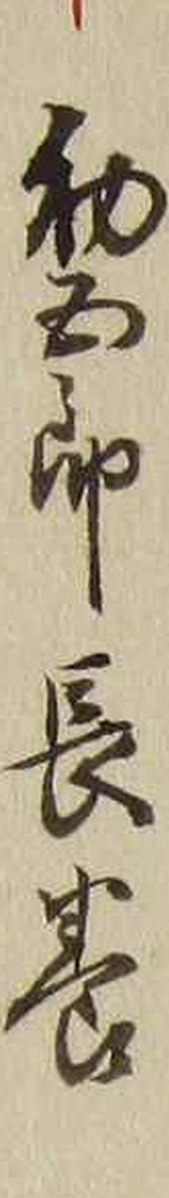初五郎長養

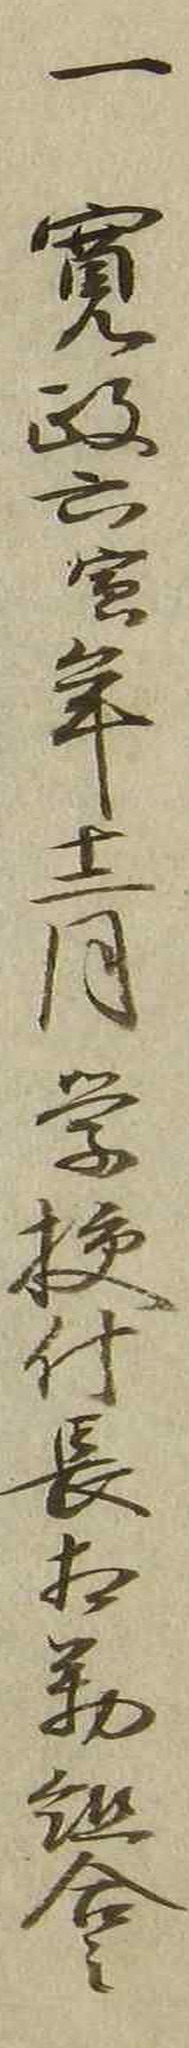一寛政六寅年十二月学校什長相勤組合之
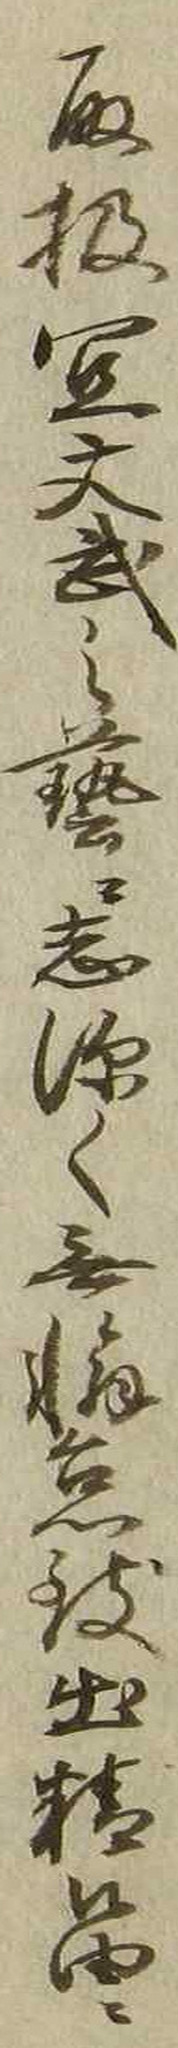殿扱宣文武之芸ニ甚深く無懈怠致出精候由ニ
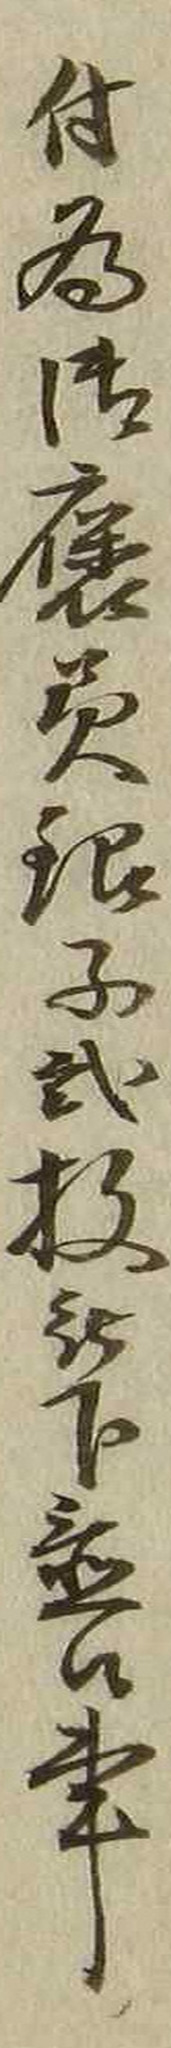付為御褒美銀子弐枚被下置候事
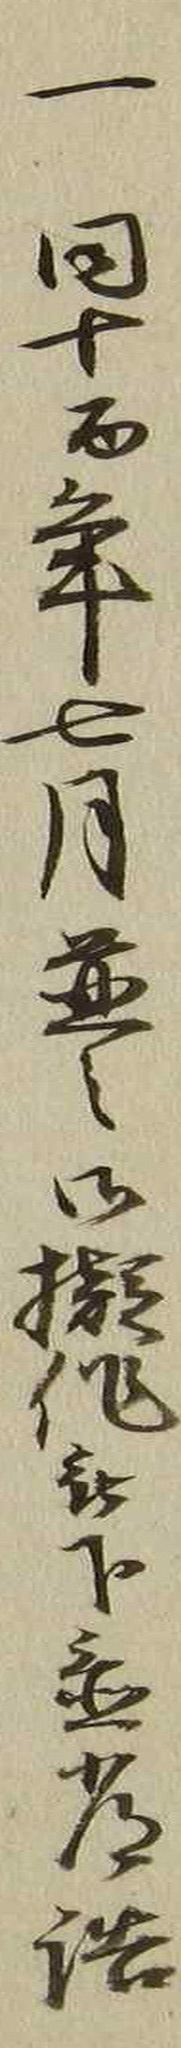一同十酉年七月並之御擬作被下置常詰
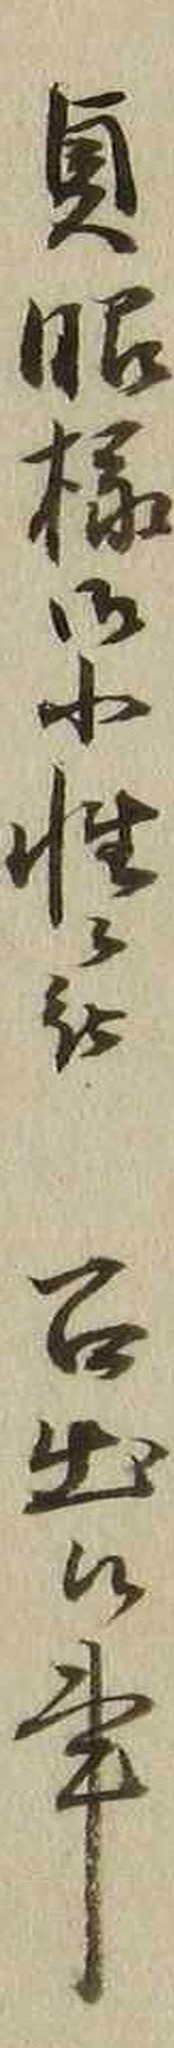貞昭様御小姓ニ被召出候事
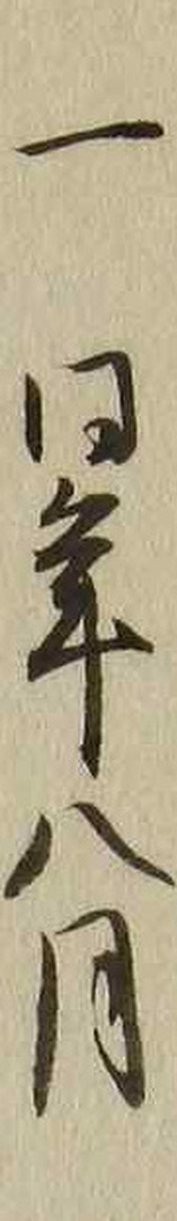一同年八月
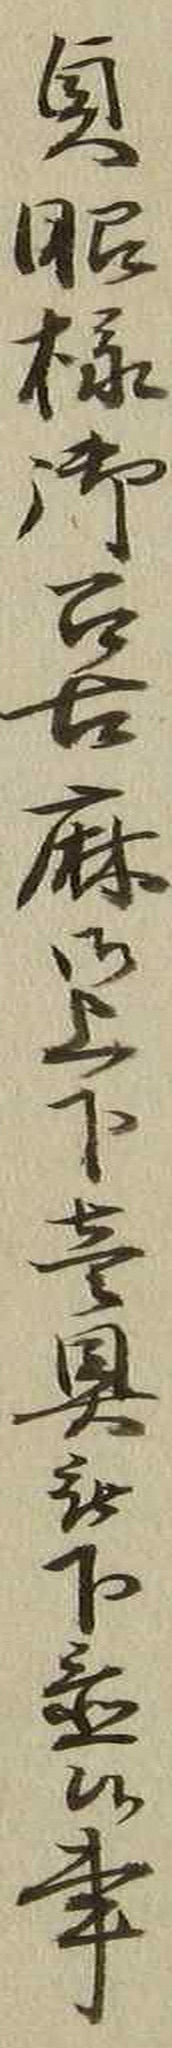貞昭様御召古麻御上下壱具被下置候事
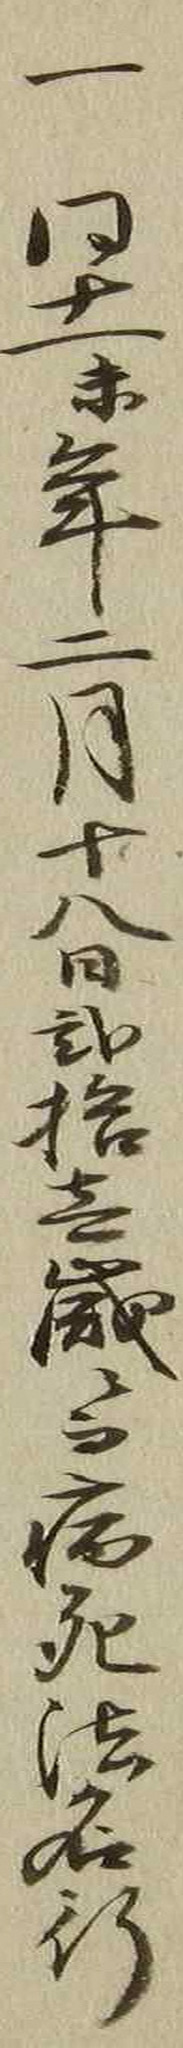一同十一未年二月十八日弐拾壱歳ニ而病死法名行
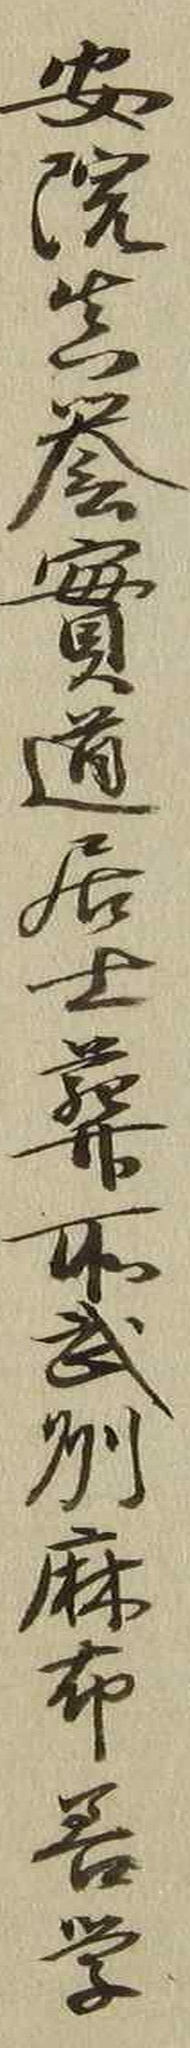安院真誉実道居士葬所武州麻布善学
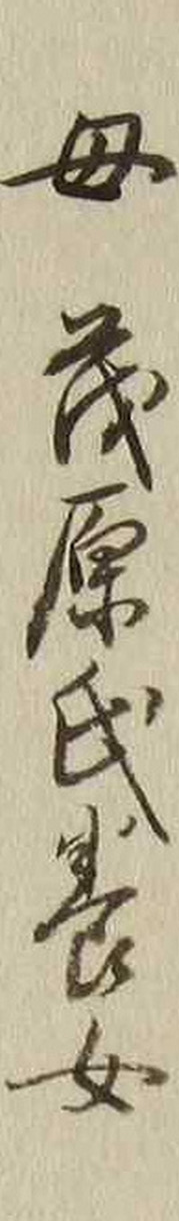母茂原氏養女
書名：諸士系譜　巻之114　か之部22
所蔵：会津若松市立会津図書館
